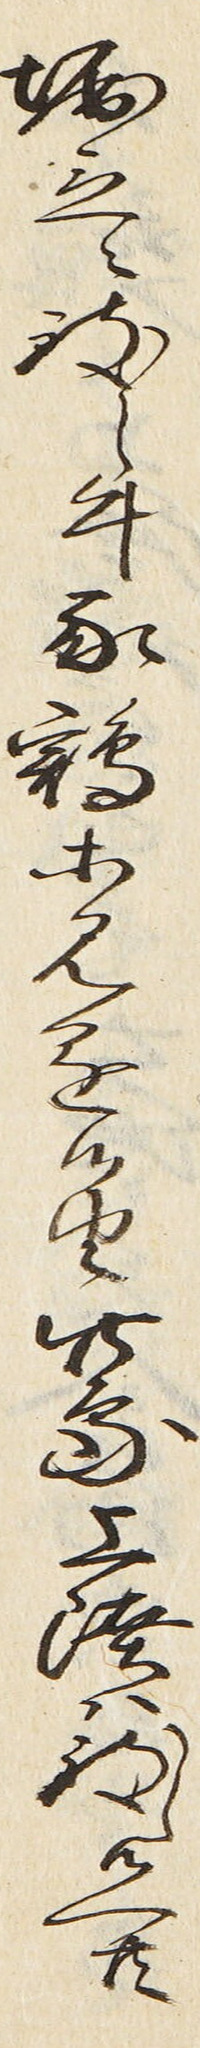掘立に致し牛豕鶏等見懸候由此島上陸は致し候へ共
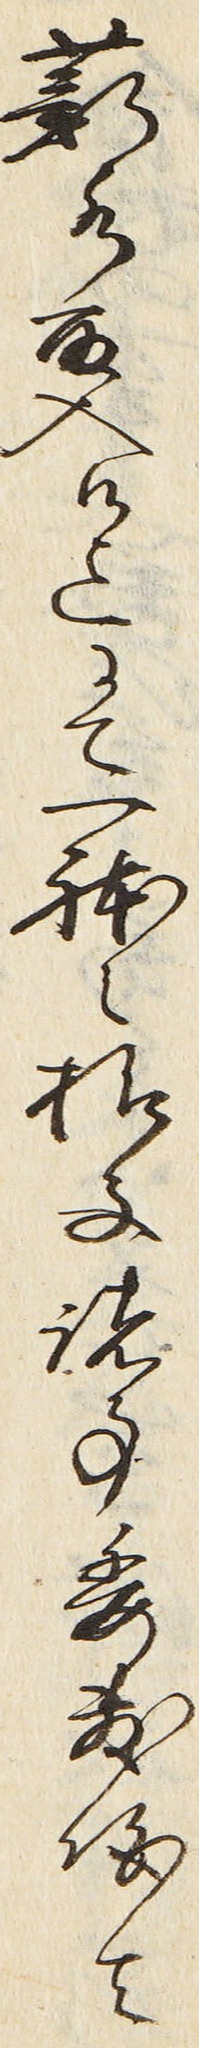薪水取入候迄にて一躰之様子諸事委敷儀は
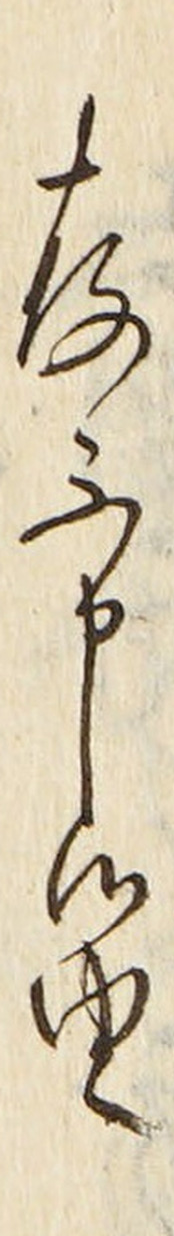存不申候由
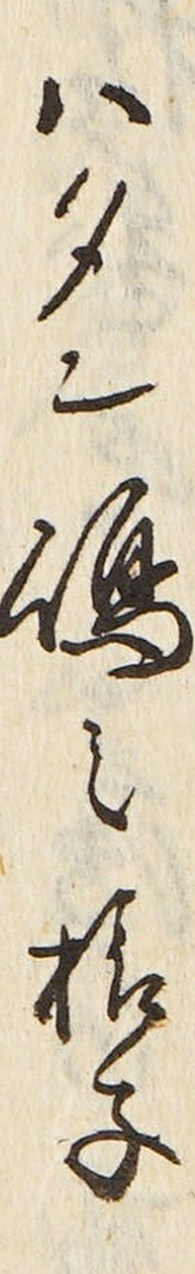ハタン嶋之様子
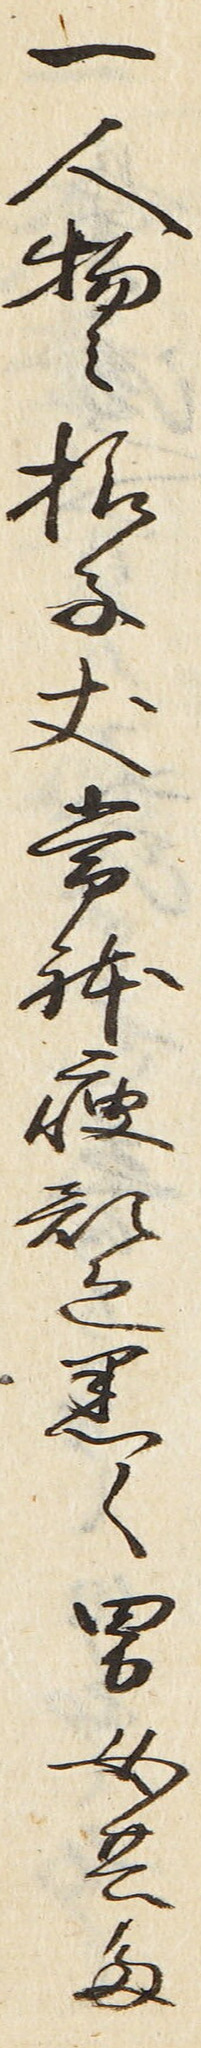一人物之様子丈常躰痩顔色黒く男女共多
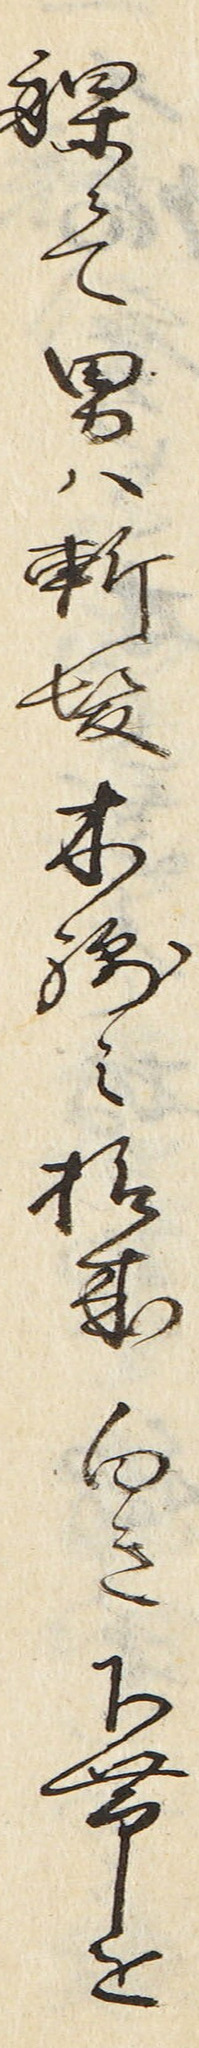裸にて男は斬髪木綿之様成白き下帯を

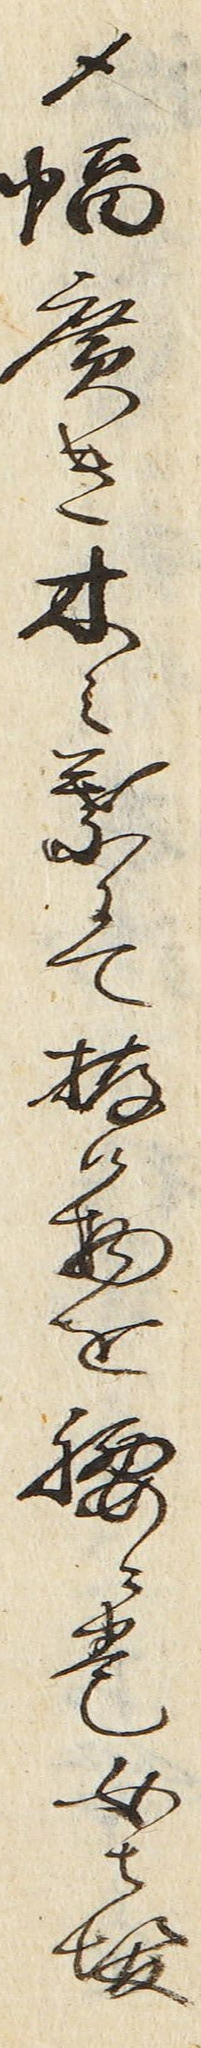〆幅広き木之葉にて拵候物を腰に巻女は髪
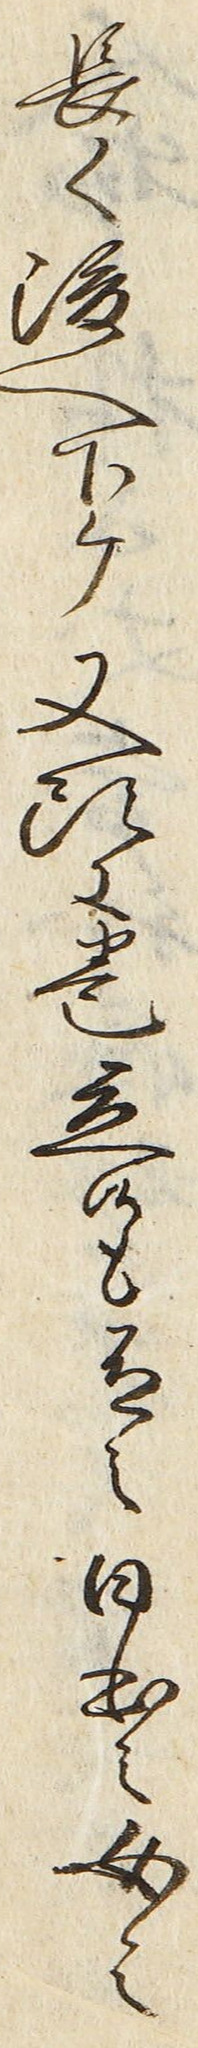長く後へ下け又頭に巻立候も有之日本之女之
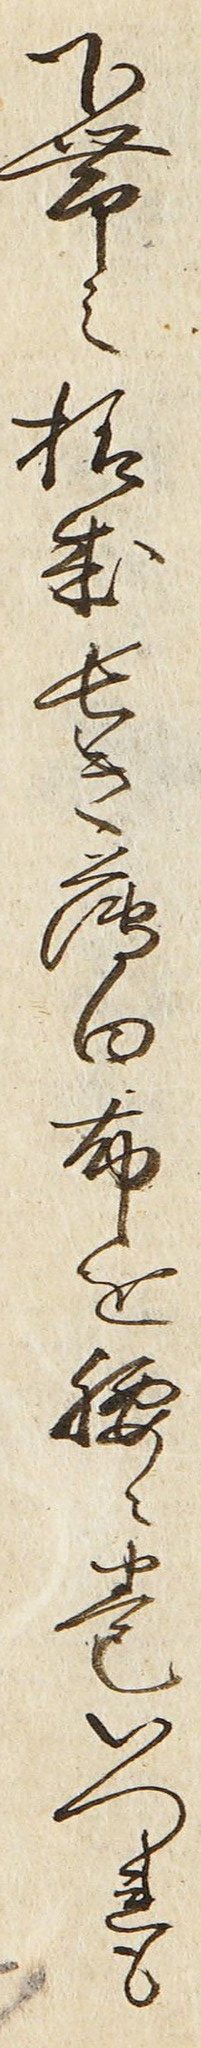下帯之様成長き薄白布を腰に巻いつれも
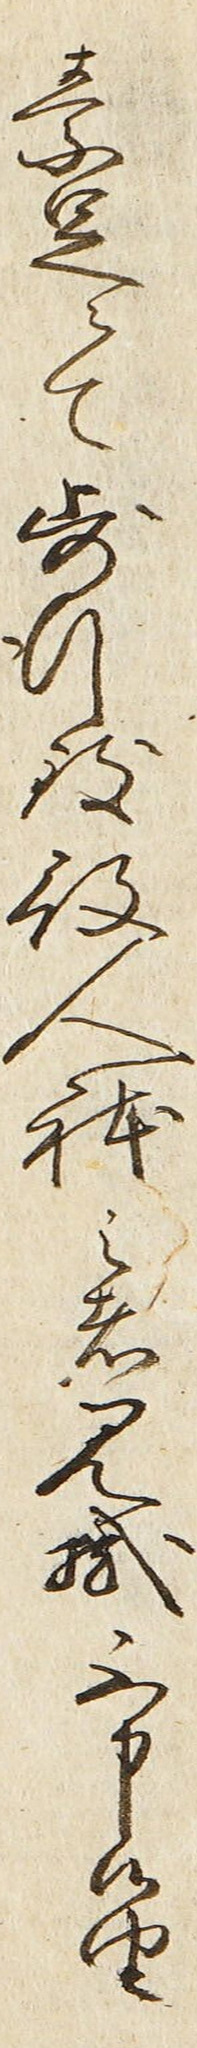素足にて歩行致役人躰之者見掛不申候由
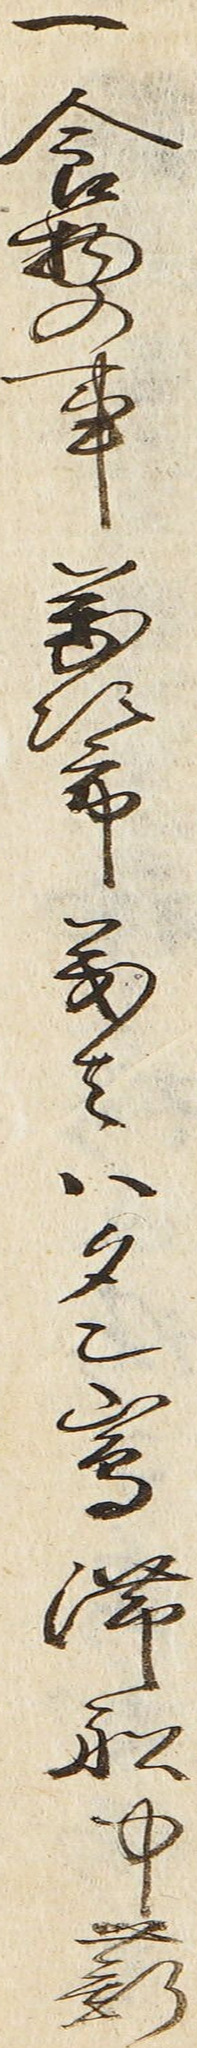一食物の事万次郎義ははハタン嶌滞船中薪
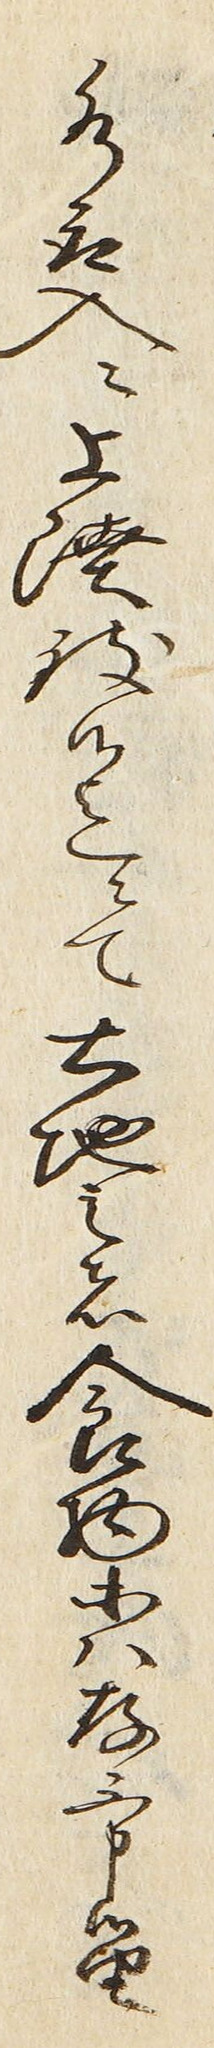水取入に上陸致候迄にて土地之者食物等は存不申候由
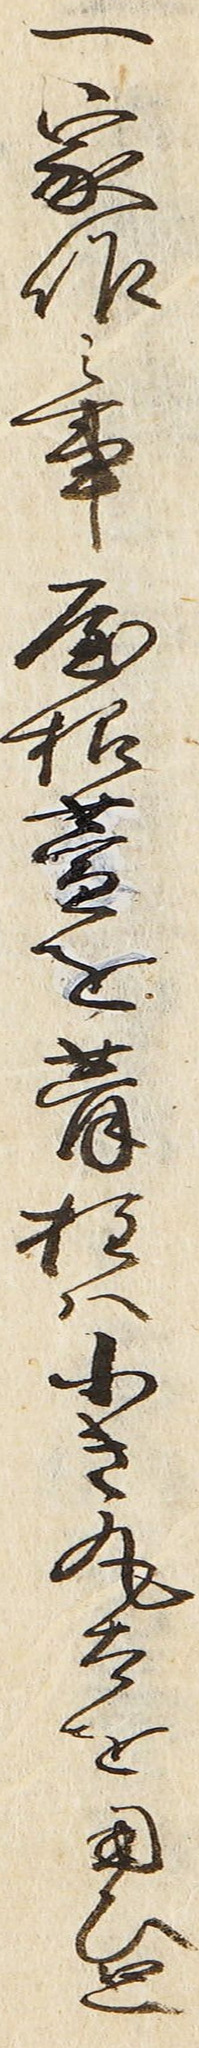一家作之事屋根萱を葺柱は小き丸太を用ひ廻
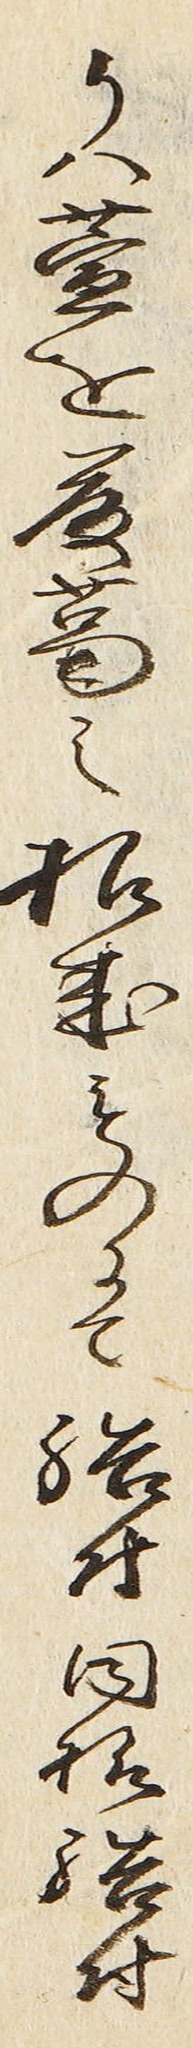りは萱を藤葛之様成ものにて結付同様結付
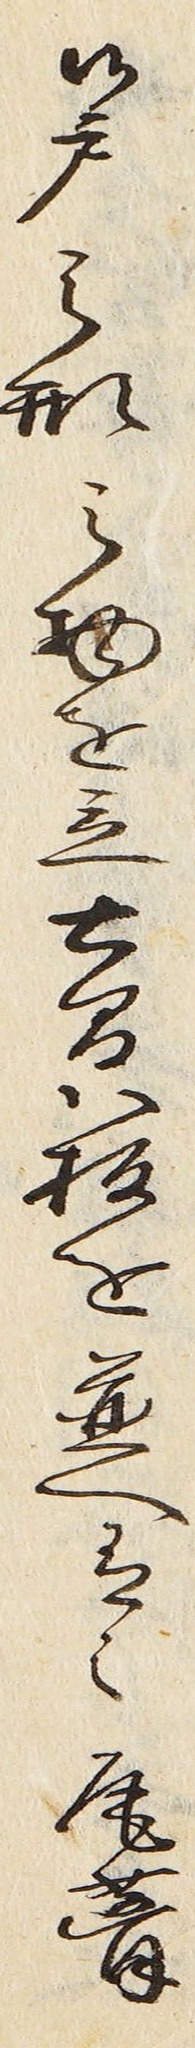候戸之形之物を立土間は板を並へ有之瓦葺
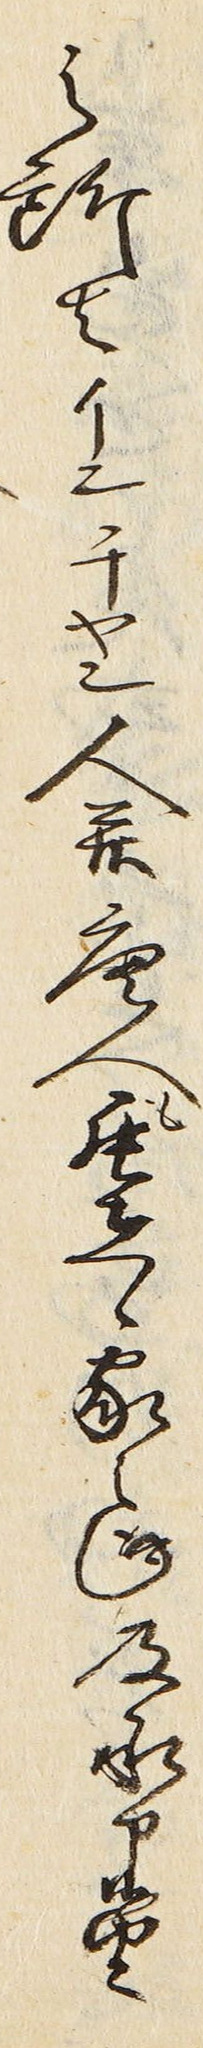之所はインチヤン人并唐人も罷在候家之趣及承申候由
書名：土佐中浜万次郎漂流記
